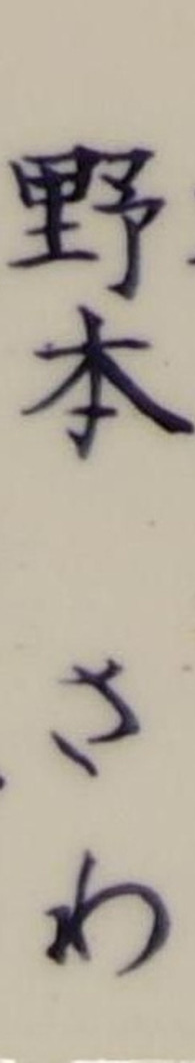野本さわ
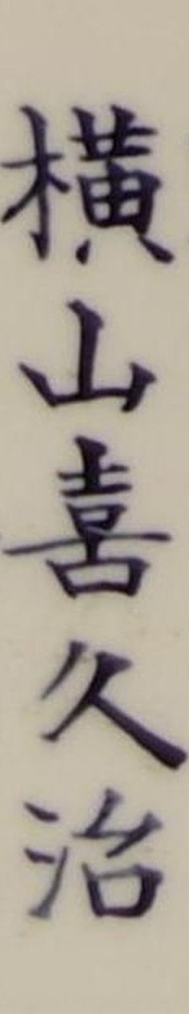横山喜久治
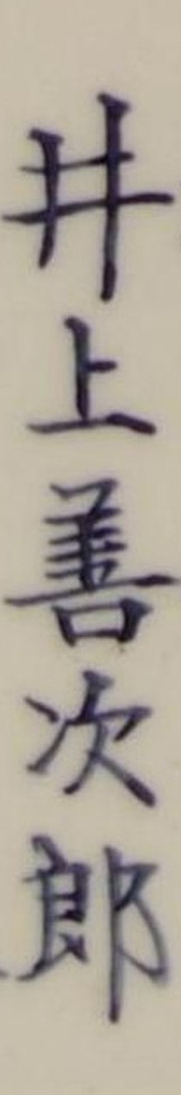井上善次郎
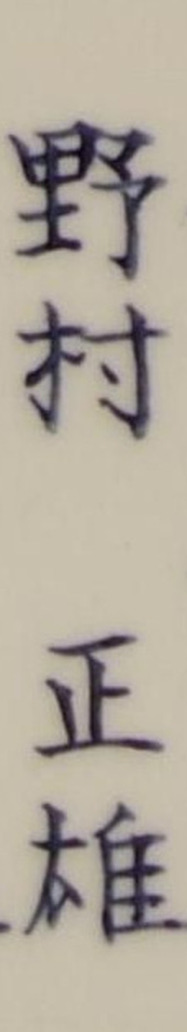野村正雄
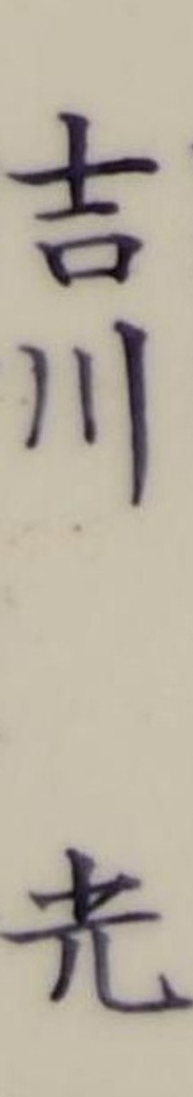吉川光
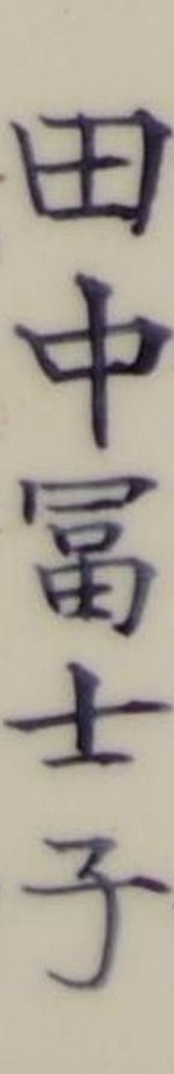田中冨士子
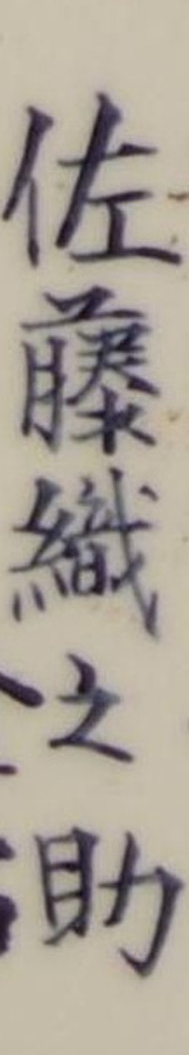佐藤織之助

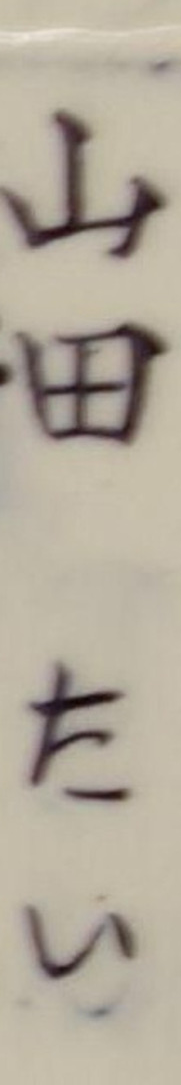山田たい
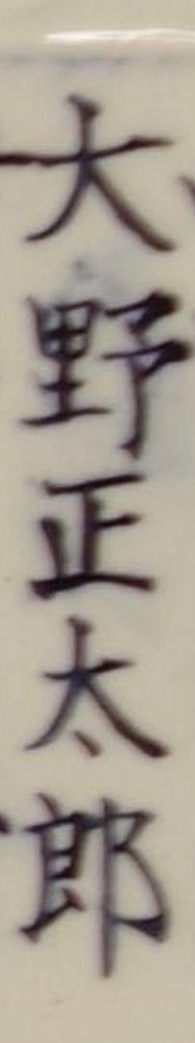大野正太郎
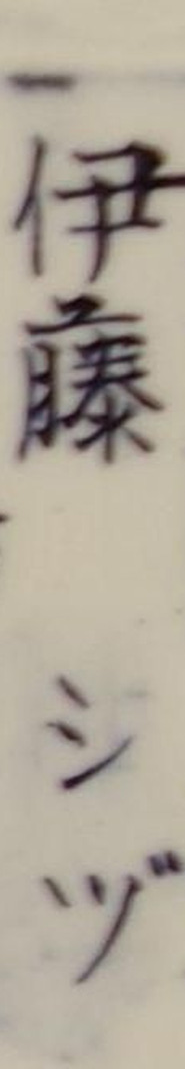伊藤シヅ
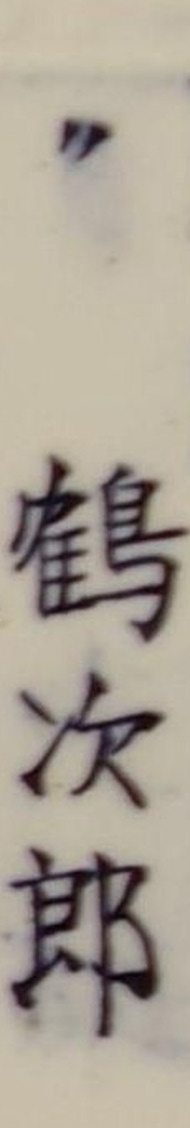鶴次郎
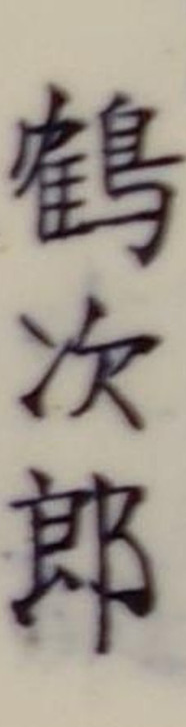鶴次郎
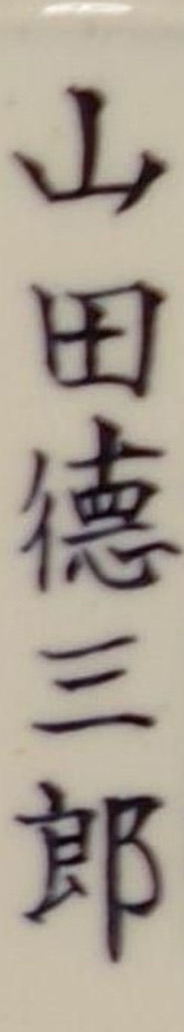山田徳三郎
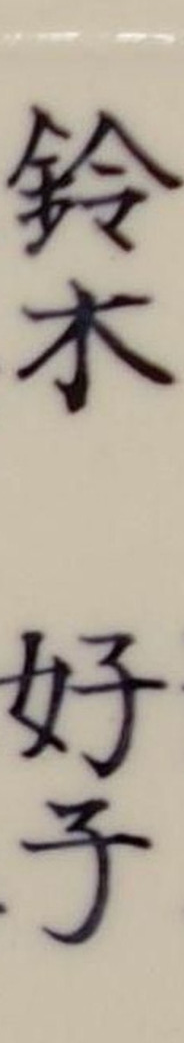鈴木好子
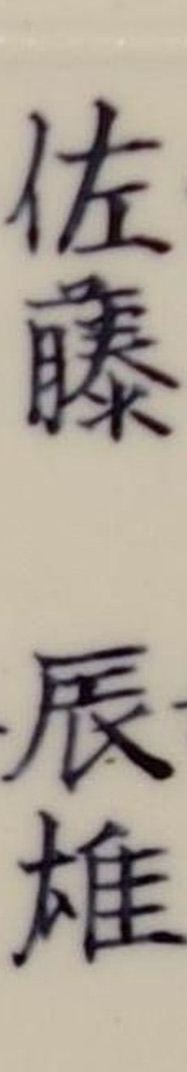佐藤辰雄
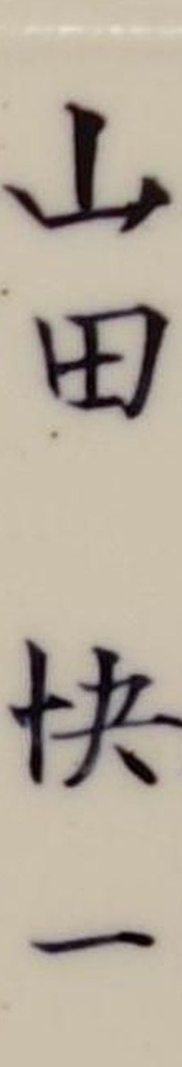山田快一
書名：M~S
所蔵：高野山金剛峯寺
